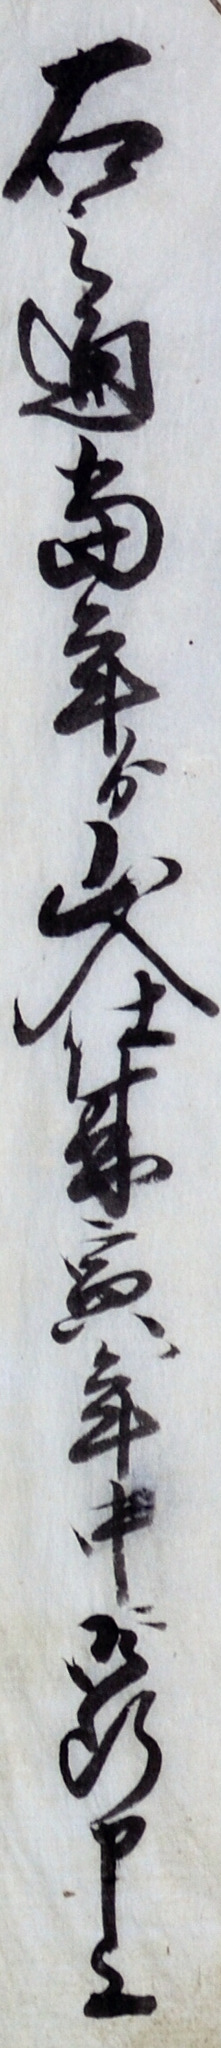右之通当年ゟ山入仕来寅年中ニ御断申上

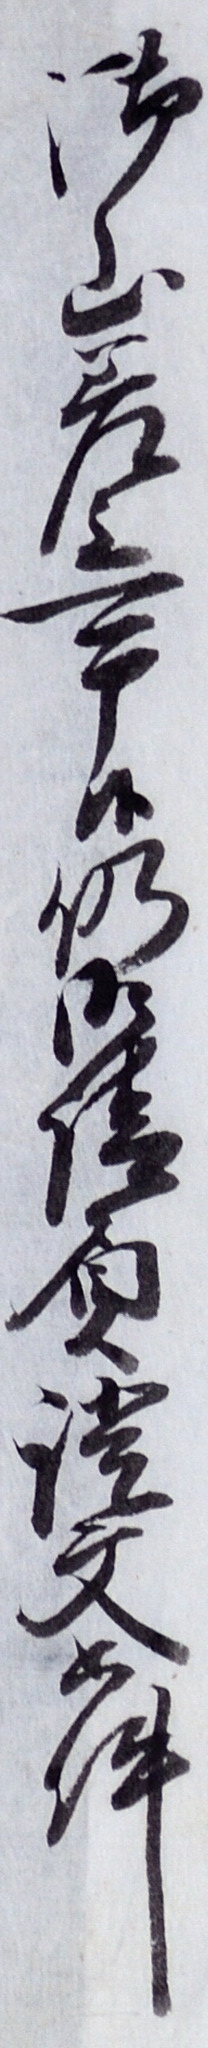御山差上可申候仍御請負証文如件
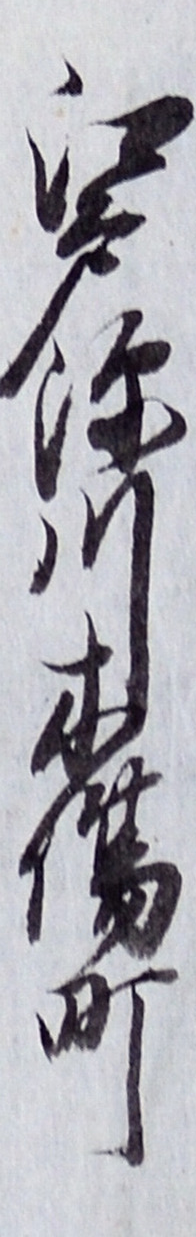江戸深川木場町
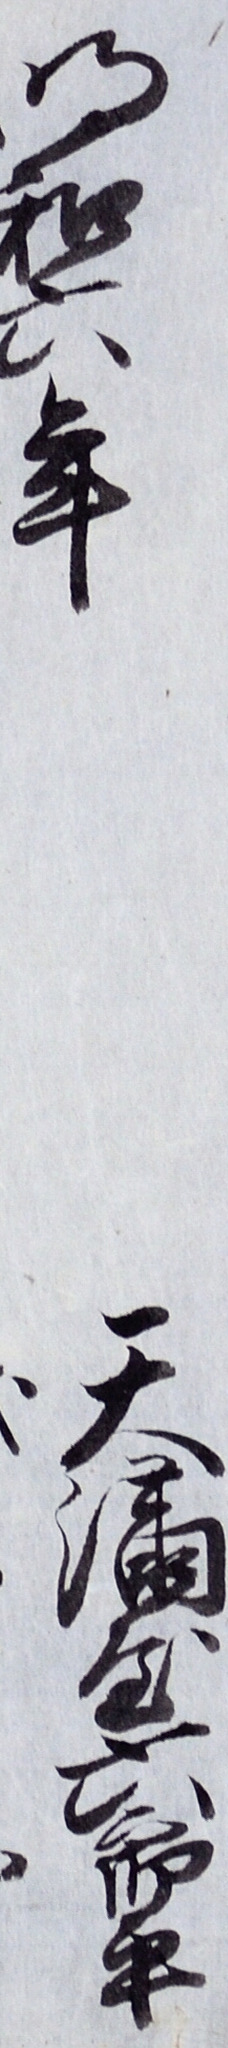明和六年天満屋六郎平
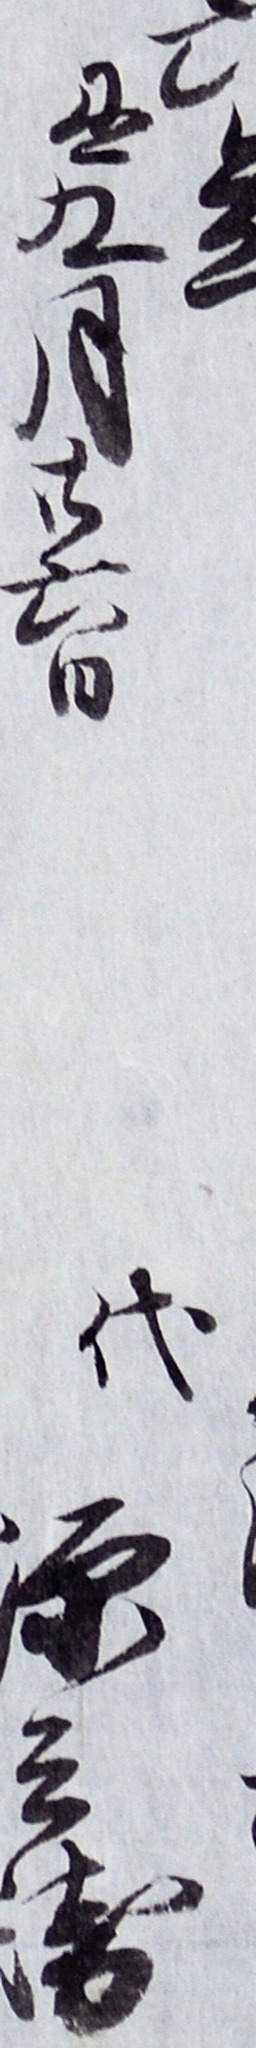丑九月廿六日代源兵衛
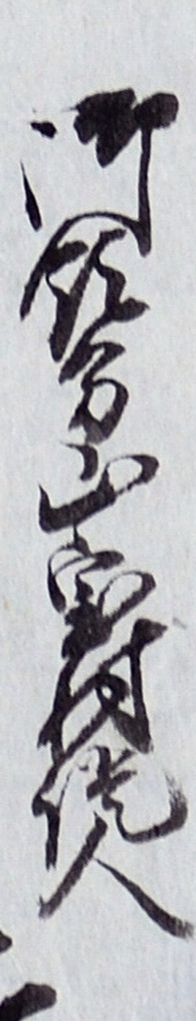御領分山室村証人
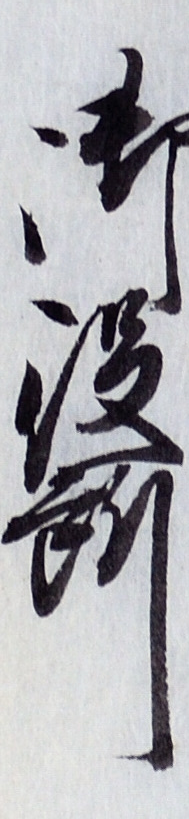御役所
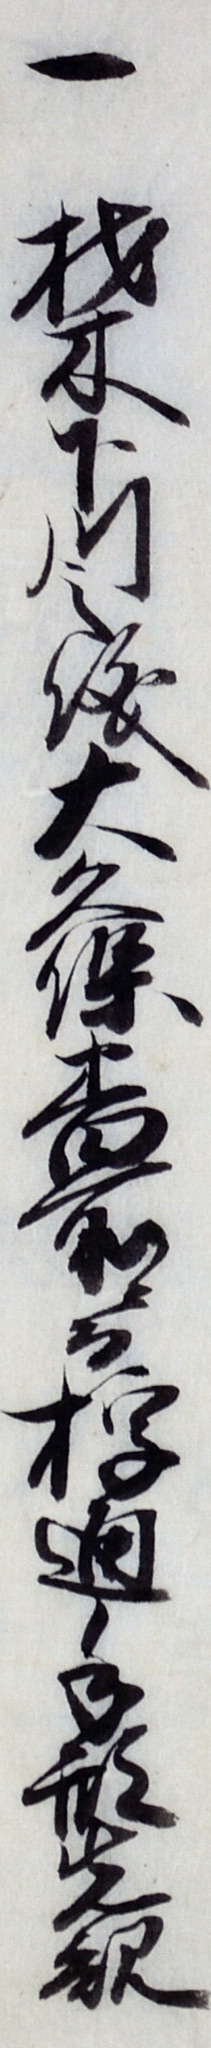一材木下川之儀大久保番所ニ而桴通手形先規
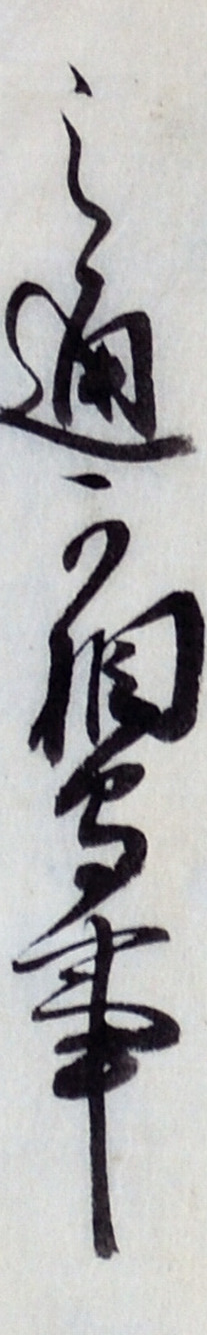之通可相守事
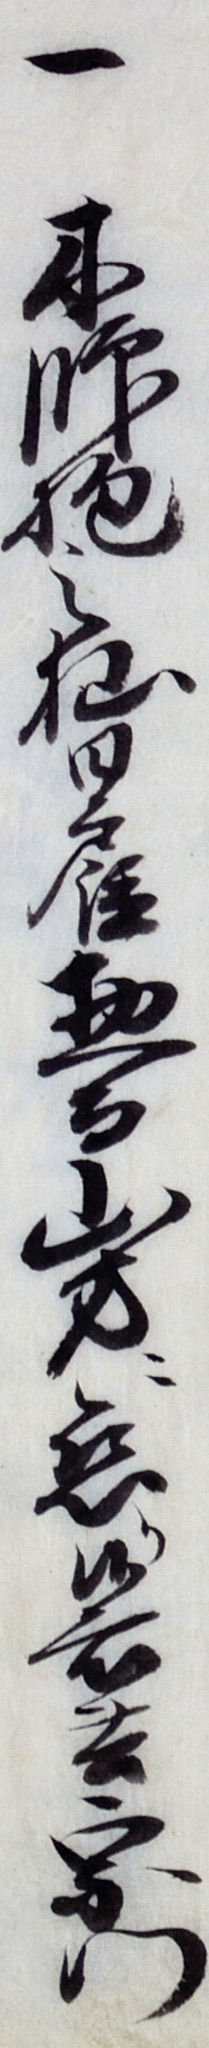一木師抱之杣日雇惣而山方ニり候者共宗門
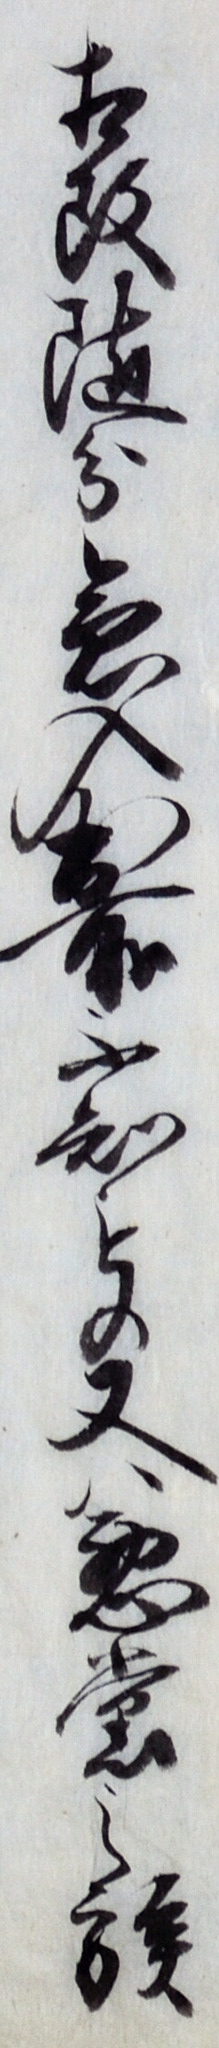相改随分念入出所不知もの又ハ悪党之族
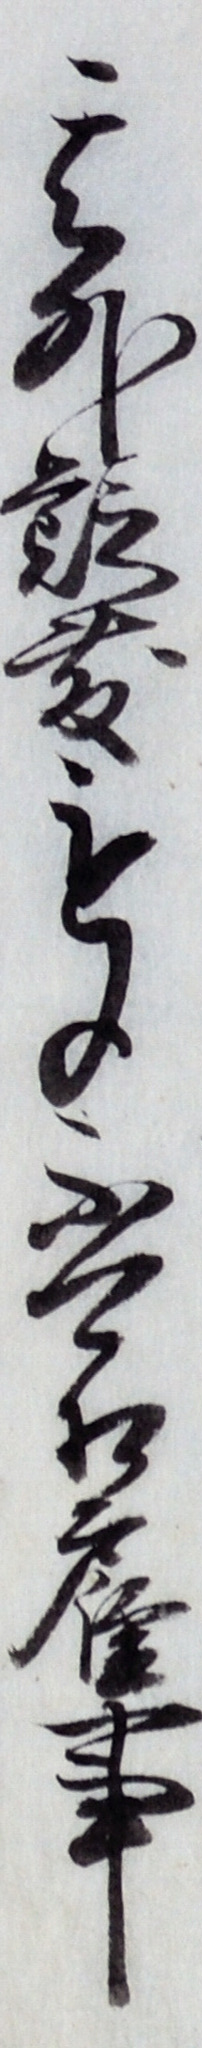其外疑敷もの不可相雇事
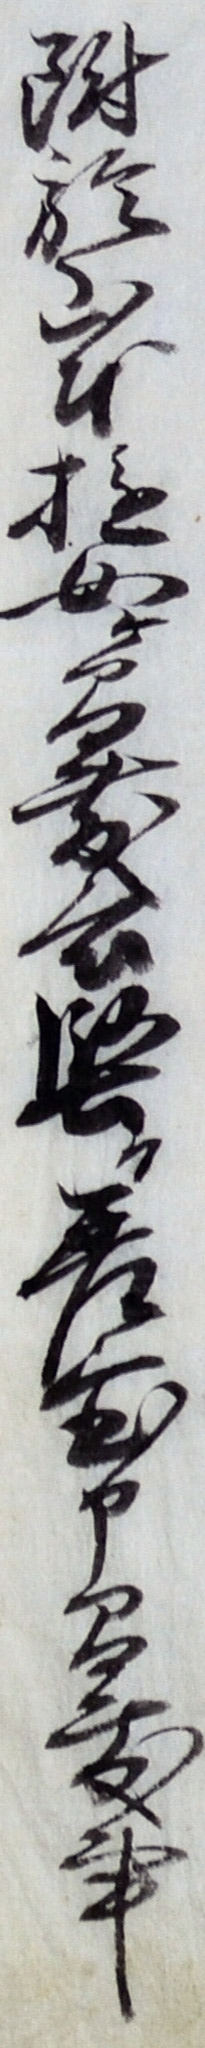附於山本遊女ケ間敷者堅ク差置申間敷事

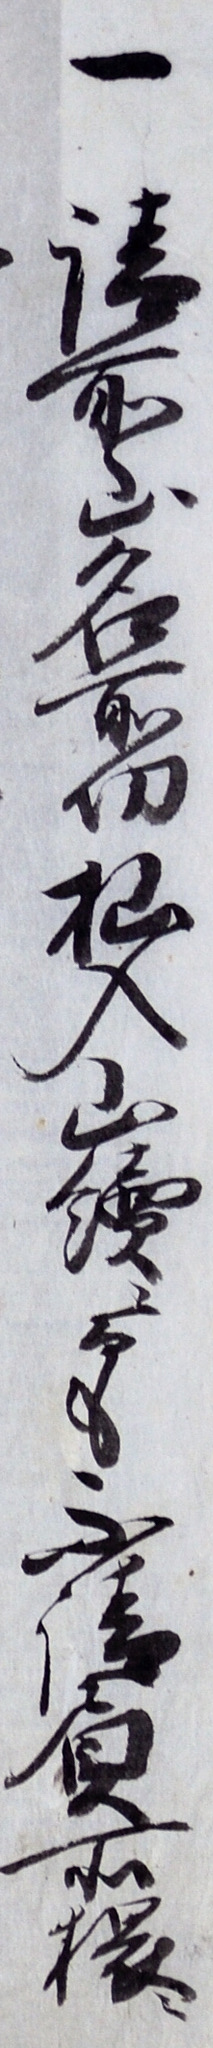一請所山名所切杣入山続ニ而も不請負所猥ニ
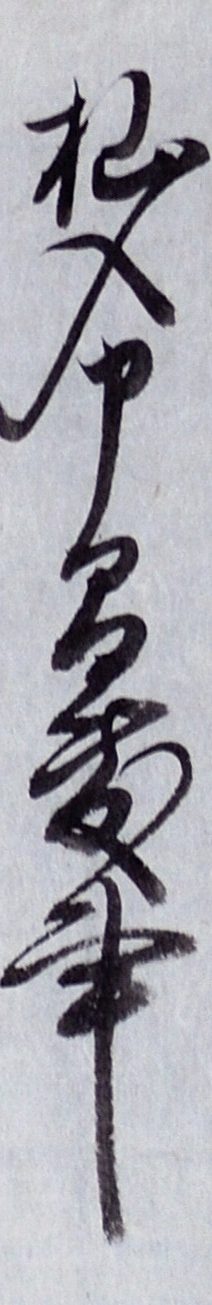杣入申間敷事
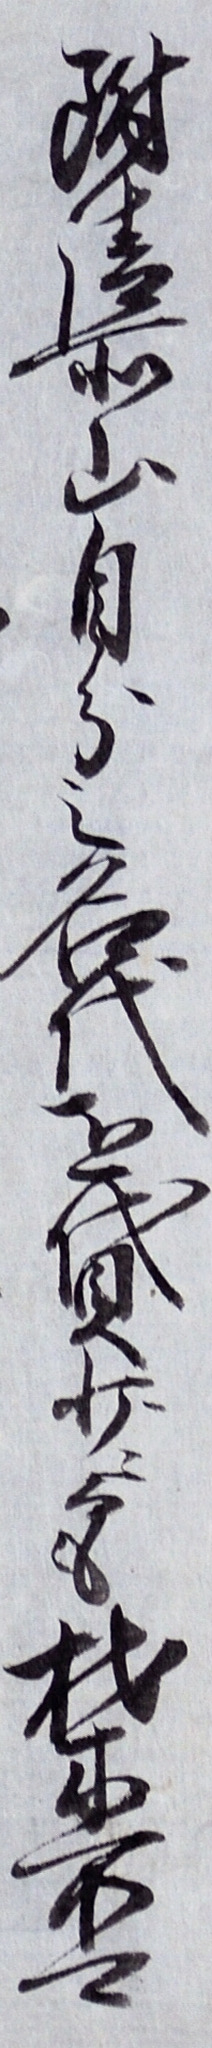附請所山自分之名代を貸少ニ而も材木不可
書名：御持山御払掟書願書控
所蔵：伊那市立高遠町図書館・合同会社AMANE
